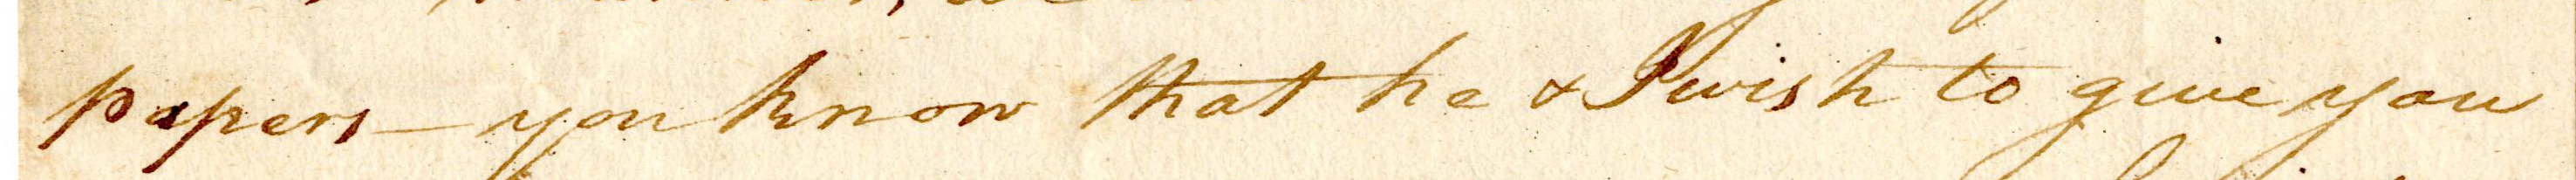papers- you know that he & I wish to give you
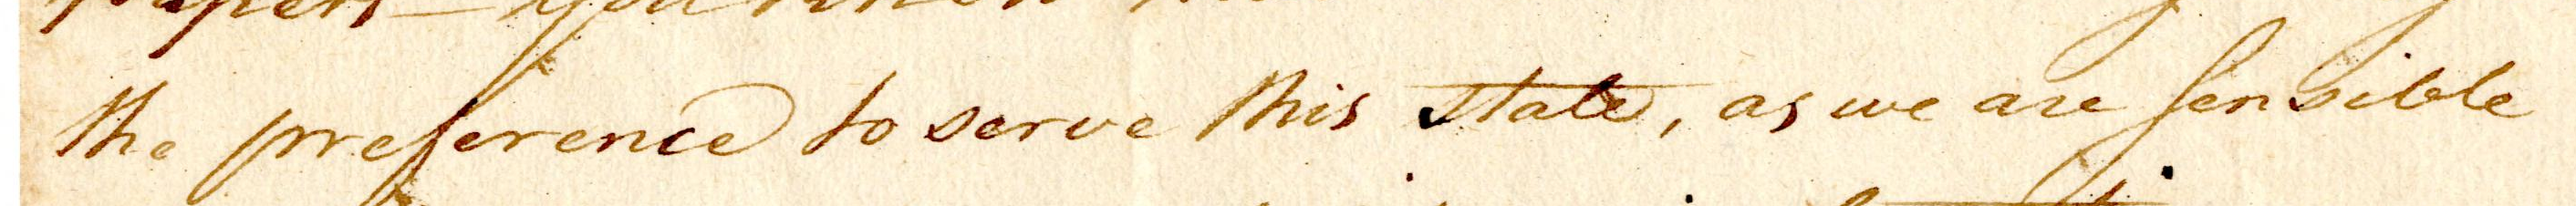the preference to serve this state, as we are sensible
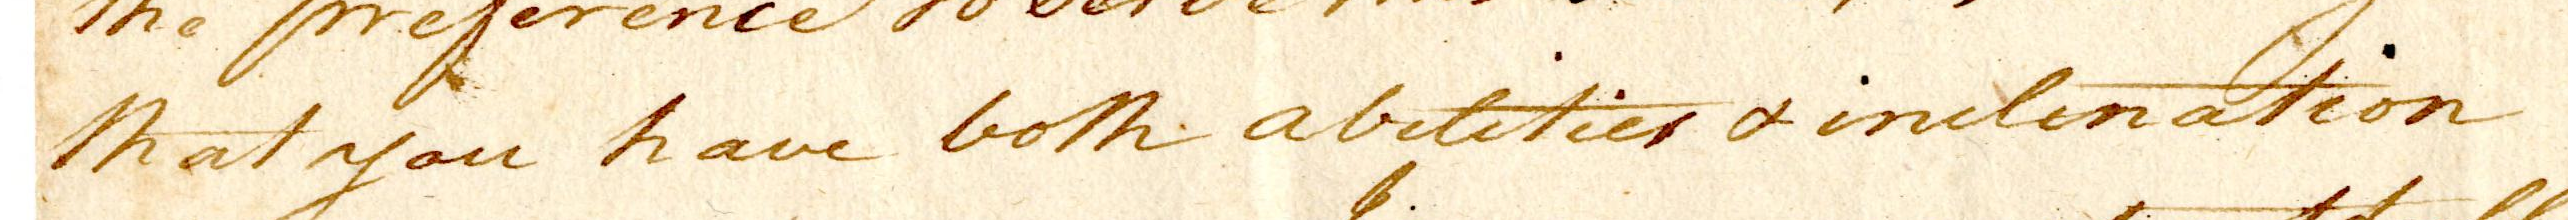that you have both abilities & inclination
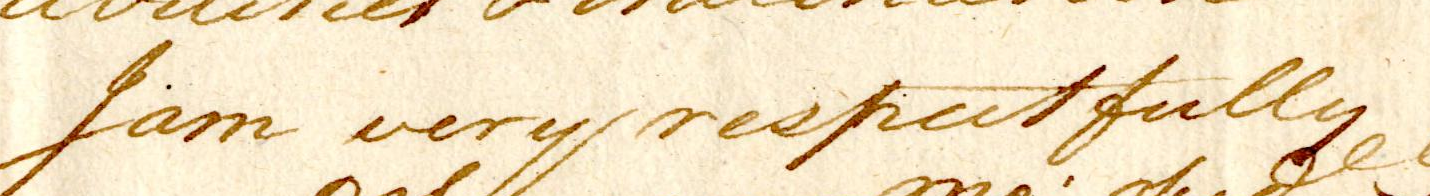I am very respectfully
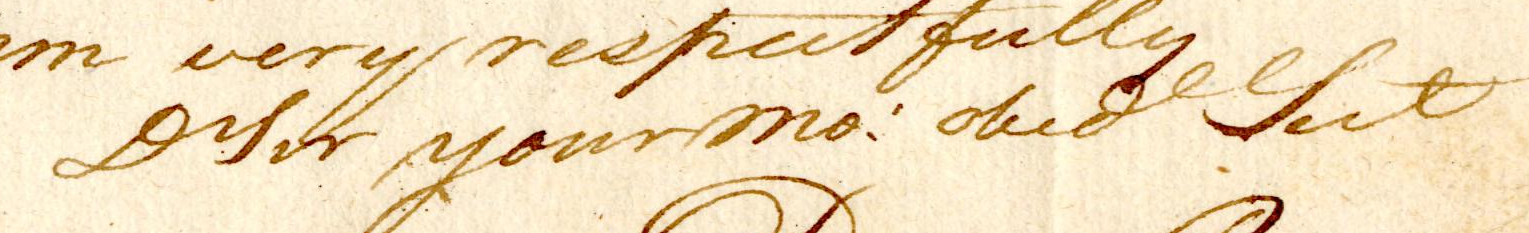D^r Sir your mo: obed^t Ser^t
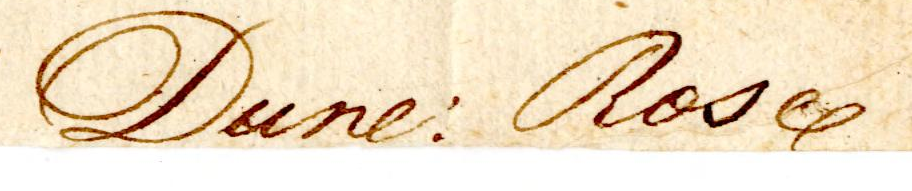Dune: Rose
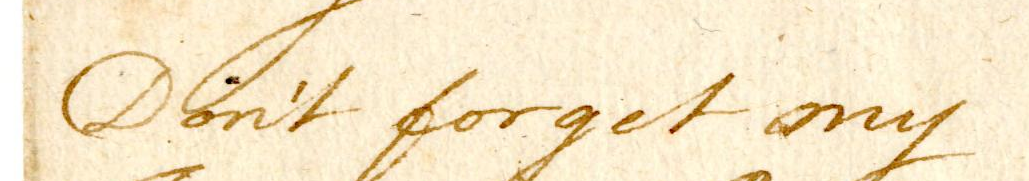Don't forget my
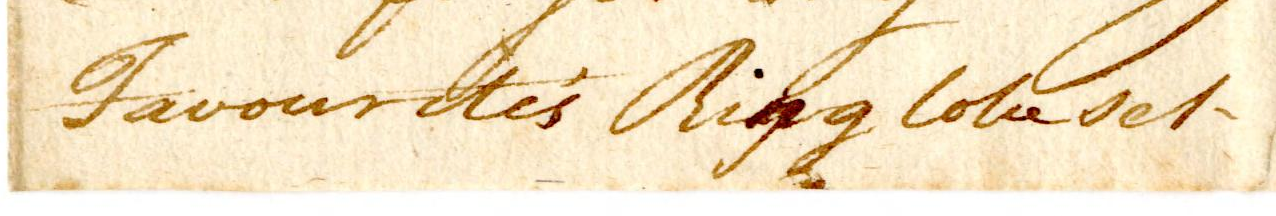Favorites Rigg to be set
